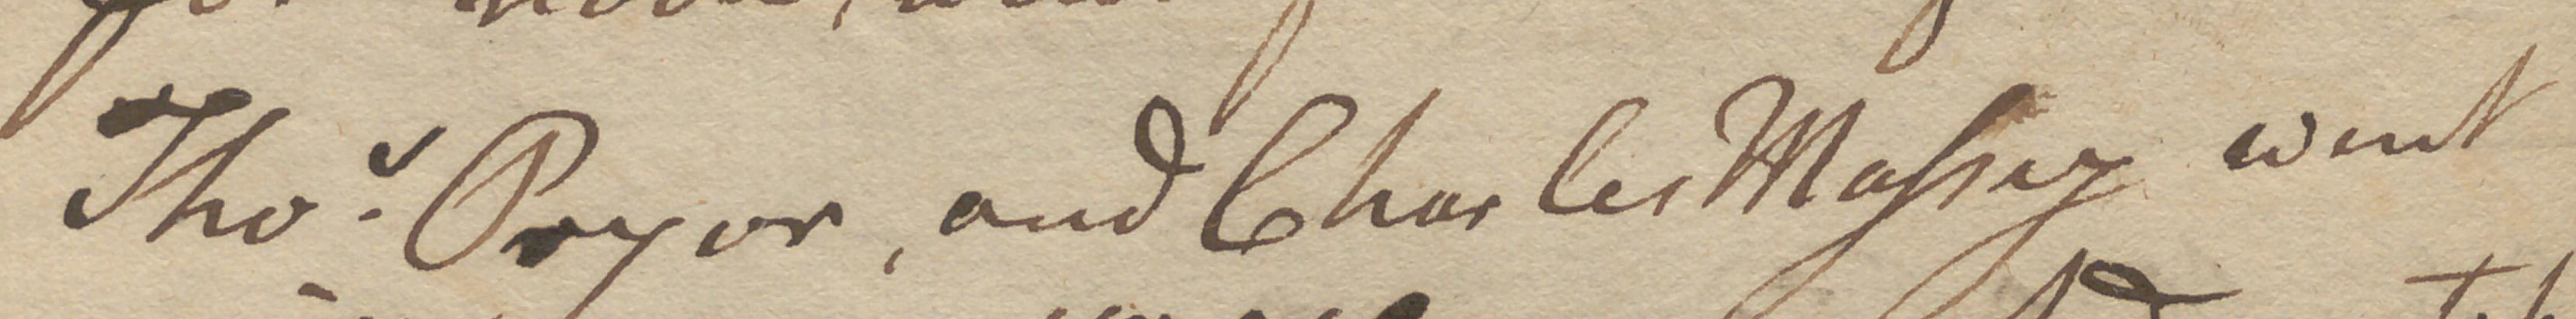Tho^s. Pryor and Charles Massey went
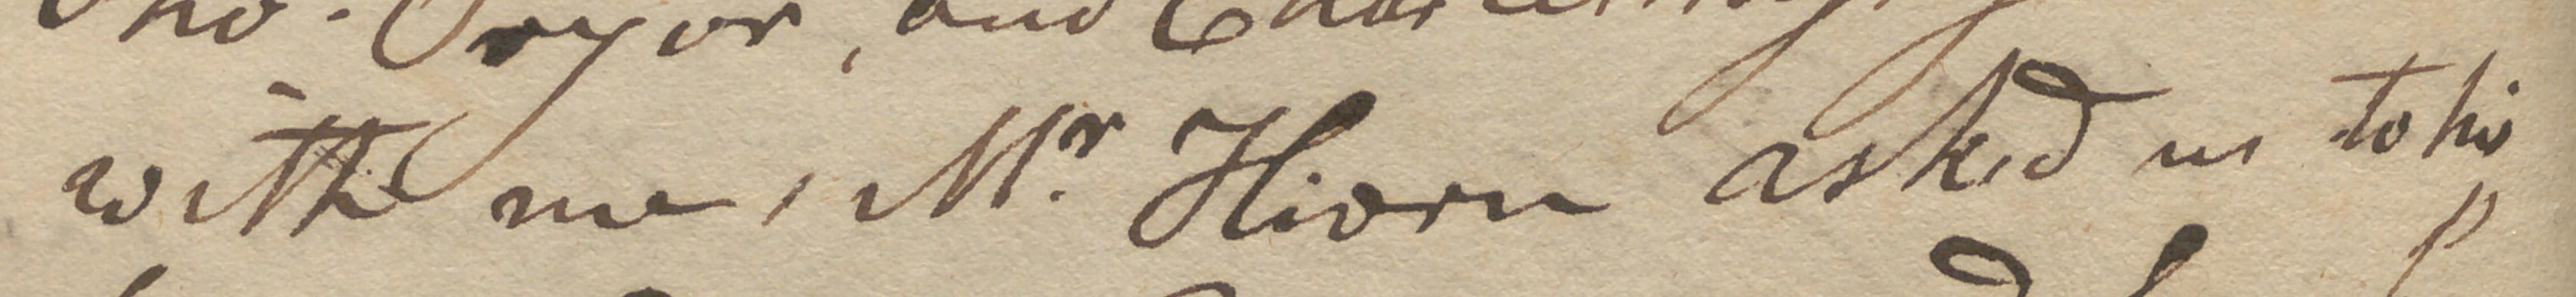with me, M^r. Horn asked us to his
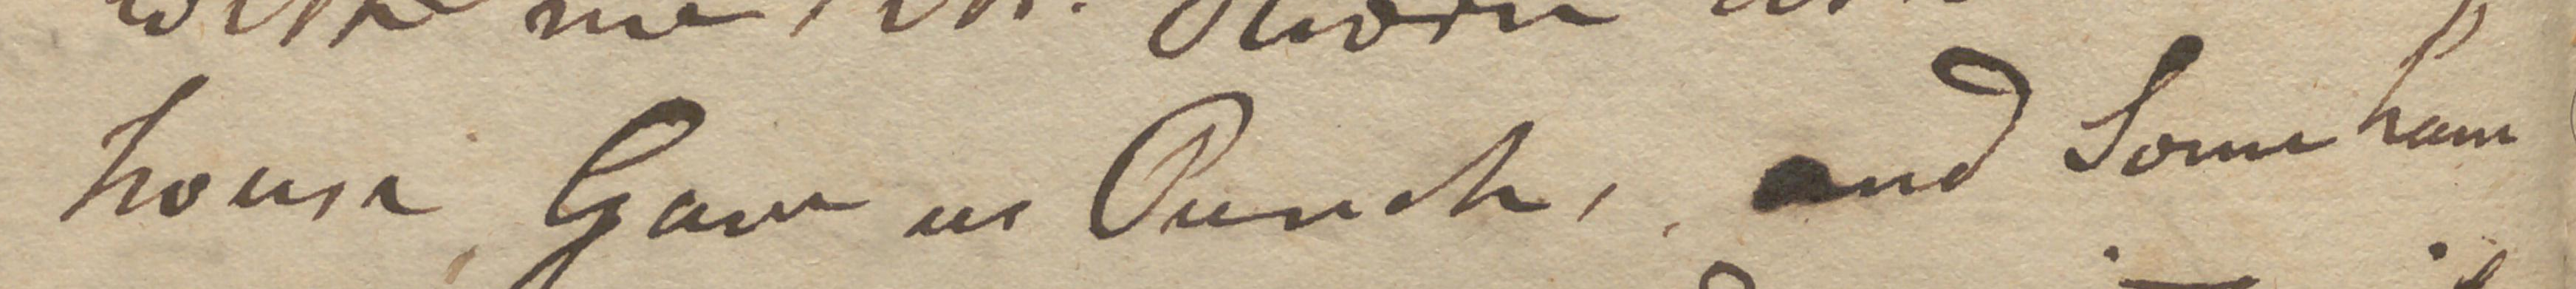huse Gave us Punch, and some ham
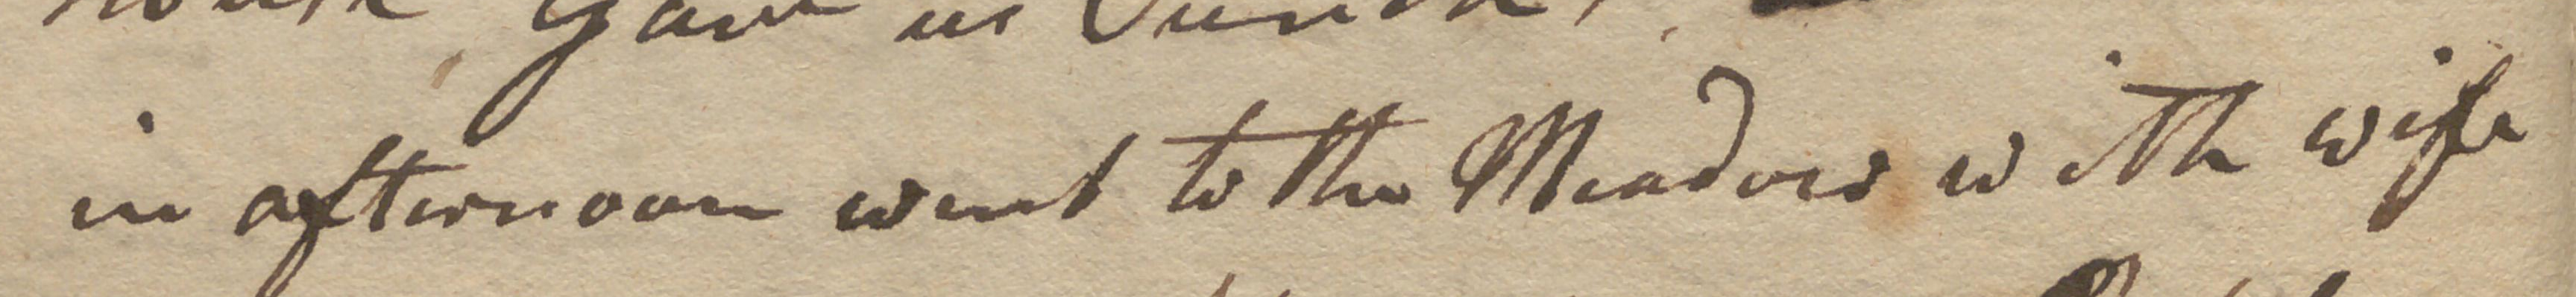in afternoon went to the Meadow with wife
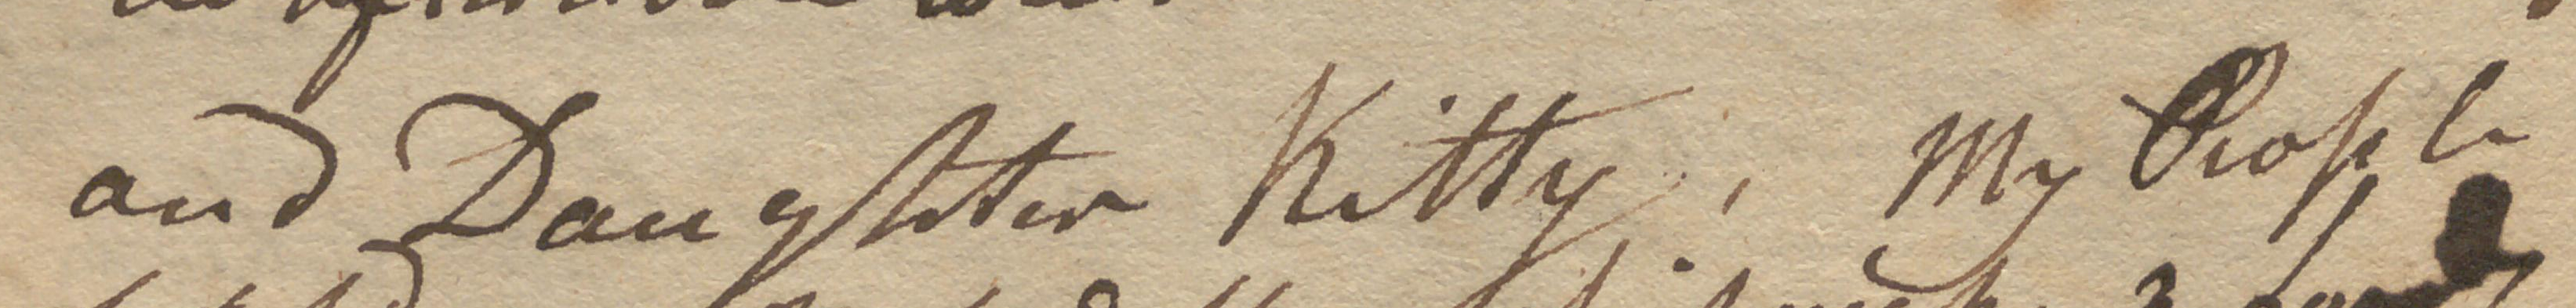and Daughter Kitty, My People
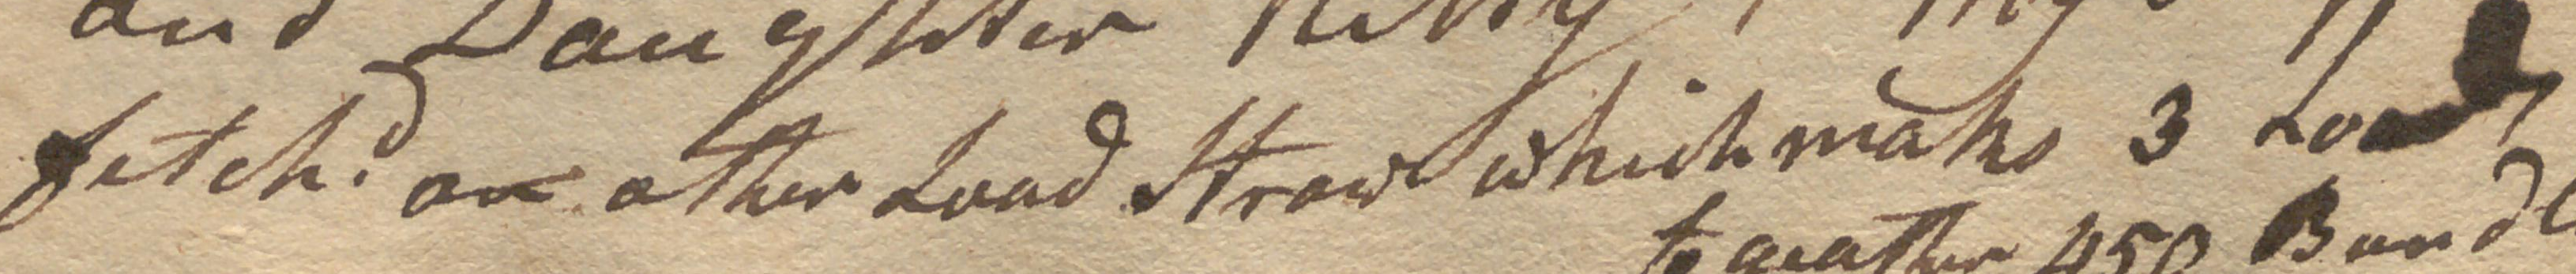fetch^d. an other Load Straw which maks 3 Load
